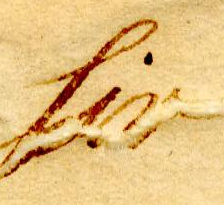Sir
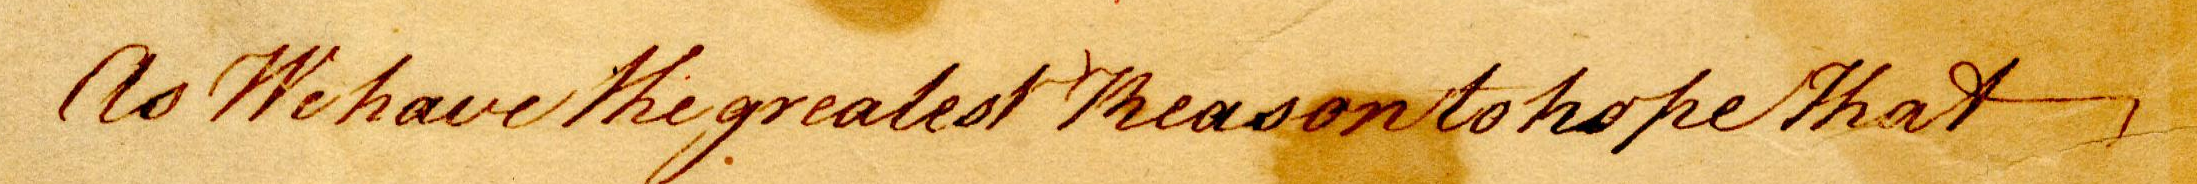As We have the greatest Reason to hope that
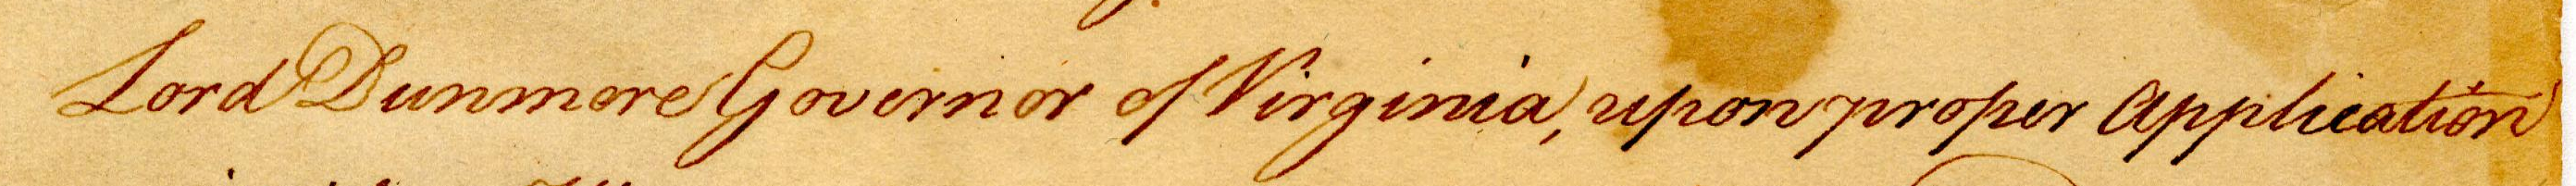Lord Dunmore Governor of Virginia, upon proper Application
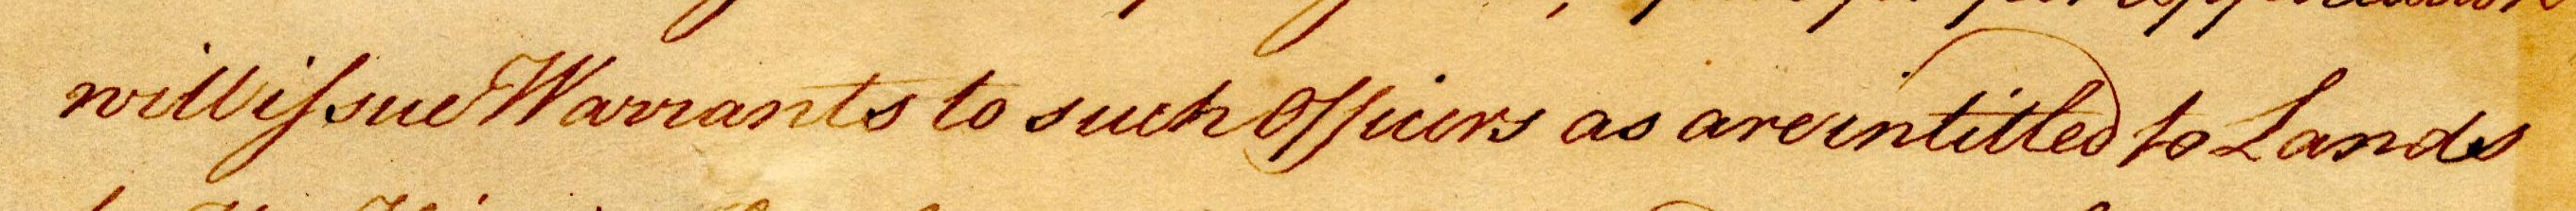will issue Warrants to such Officers as are intitled to Lands
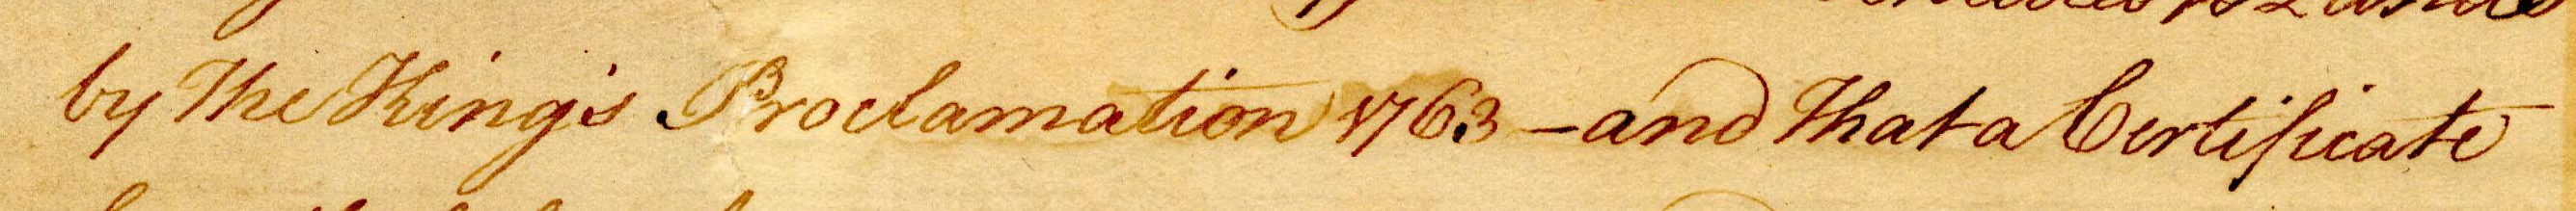by The King's Proclamation 1763- and That a Certificate
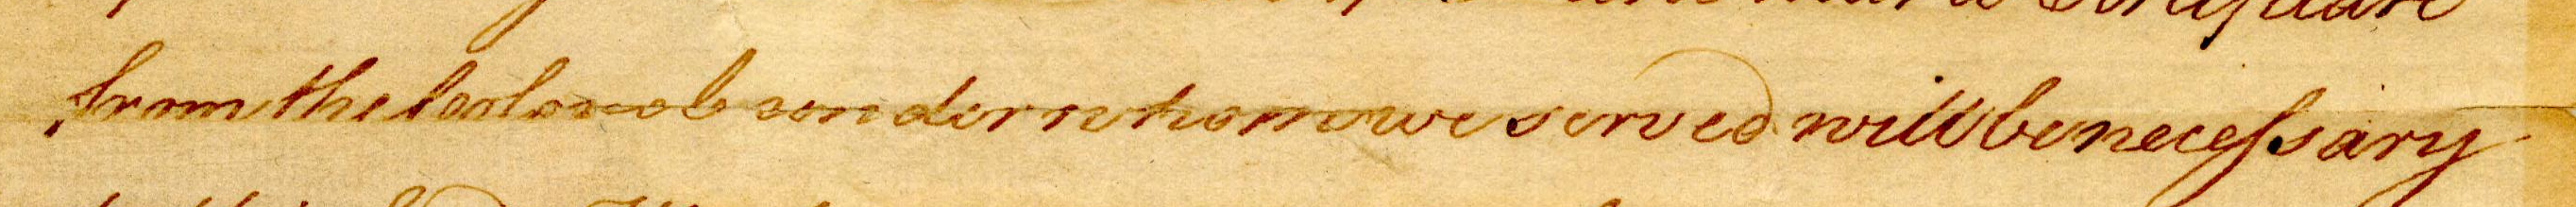from the [________________________] served will be necessary
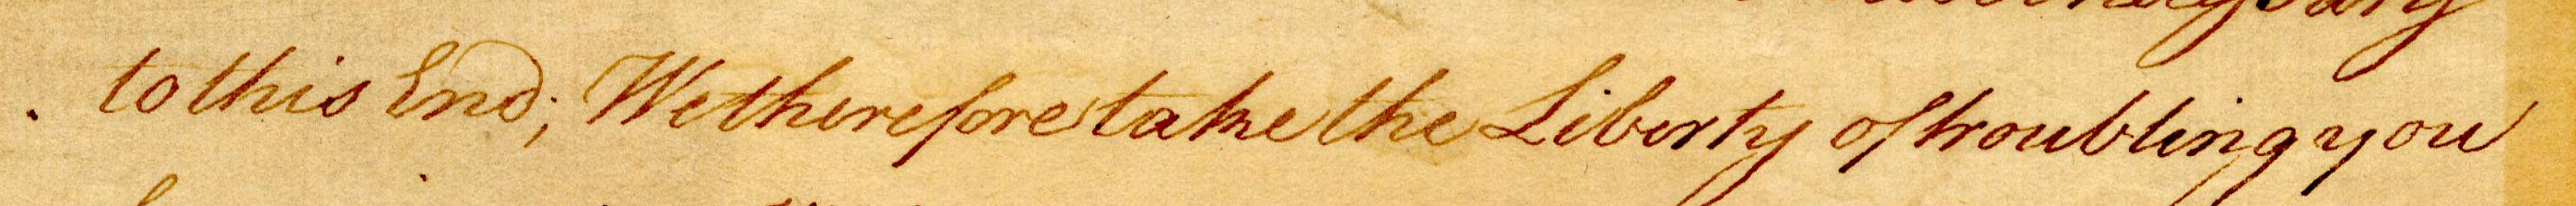to this End; We therefore take the Liberty of troubling you
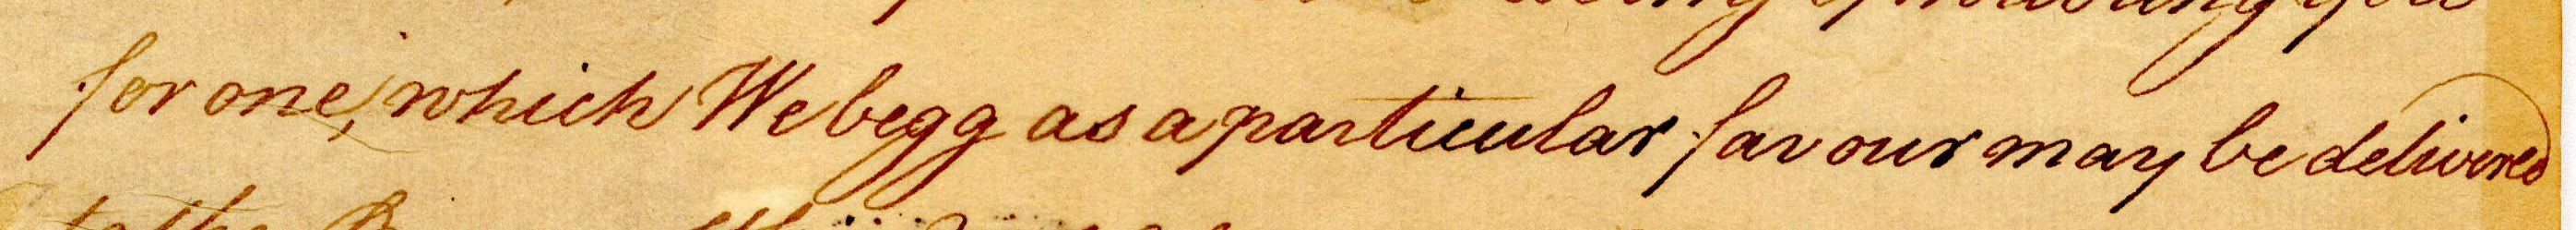for one, which We begg as a particular favour may be delivered
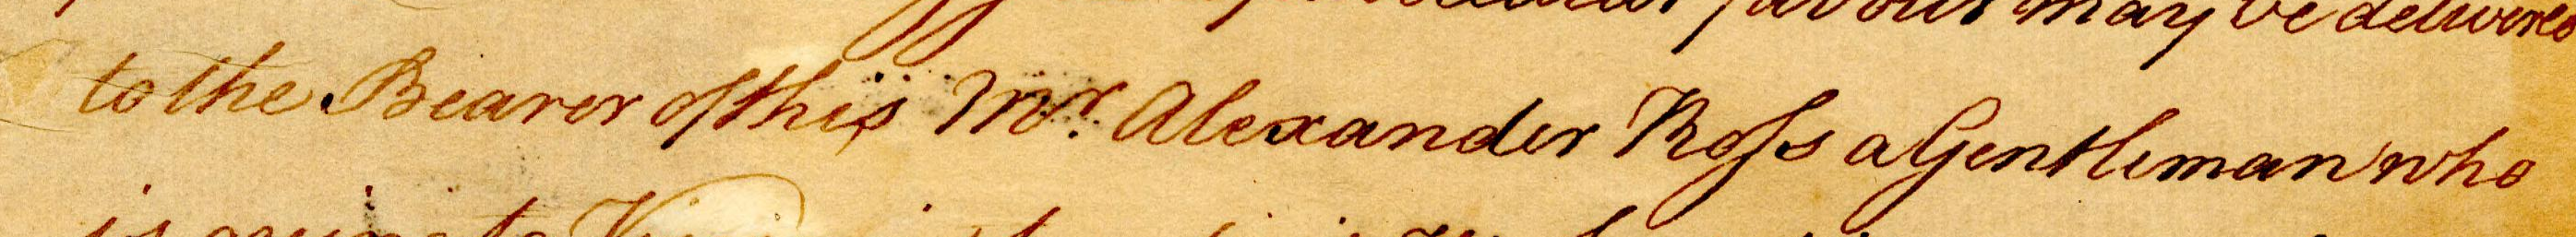to the Bearer of this M^r. Alexander Ross a Gentleman who
